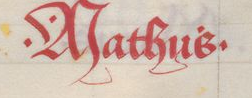.Mathuš.
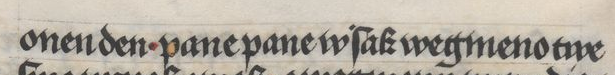onen den.pane pane wẛak wegmeno twe
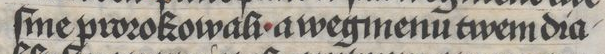ſme prorokowali.a wegmenu twem dia¬
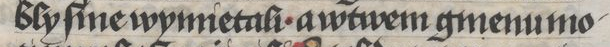bly ſme wymietali.a wtwem gmenu mo¬
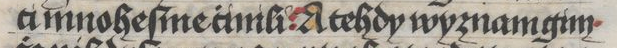ci mnoheſme ċinili?A tehdy wyznam gim.
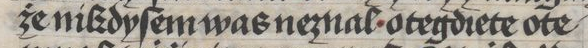że nikdyſem was neznal.otegdiete ote¬
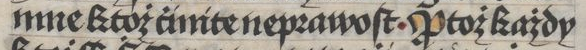mne ktoż ċíníte neprawoſt.Ꝓtoż każdy
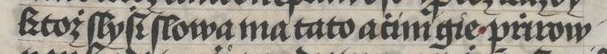ktoż ſlyẛi ſlowa ma tato a ċini gie.pṙirow¬
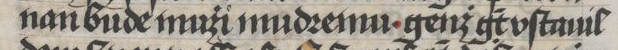nan bude mużi mudremu.genż ḡt vſtauil
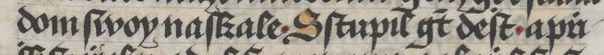dom ſwoy naſkale.Sſtupil ḡt deẛt.a pṙi¬
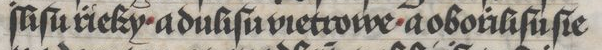ẛli ſu ṙieky.a duliſu vietrowe.a oboṙili ſu ſie
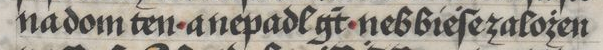na dom ten.a nepadl ḡt.neb bíeẛe zalożen
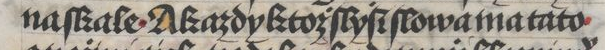naſkale.Akażdy ktoż ſlyẛi ſlowa ma tato.
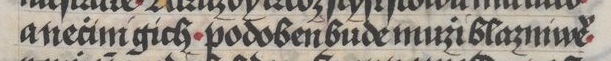a neċiní gích.podoben bude mużi blazniwev
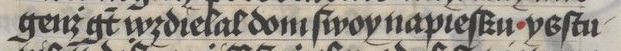genż gt wzdielal dom ſwoy napieſku.y sſtu¬
